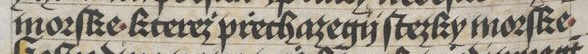morſke.ktereż pṙechazegij ſtezky morſke.
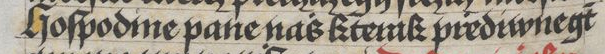Hoſpodine pane naṡ kterak pṙediwne ḡt
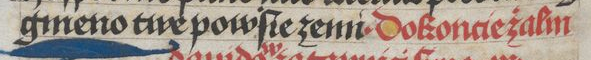gmeno twe powẛie zemi.Dokoncie żalm
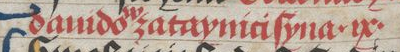davidow. zatayníci ſyna.ix.
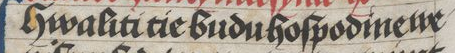Hwaliti tie budu hospodie we
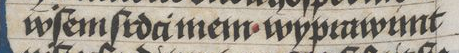wẛem ſrdci mem.wyprawímt
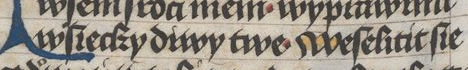wẛiecky diwy twe.Weſelitit ſie
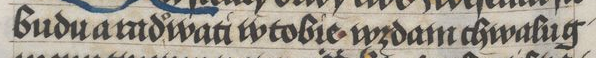budu a radowati w tobie.wzdam chwalu g¬
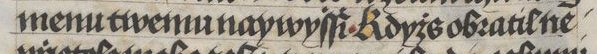menu twemu naywyẛẛi.Kdyżs obratil ne¬
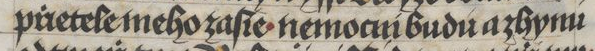pṙietele meho zaſie.nemocni budu a zhynu
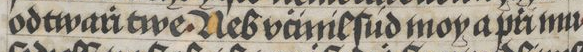odtwaṙi twe.Neb uċinil ſúd moy a pṙi mu.
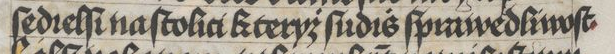ſedielſi na ſtolici kteryż ſudiṡ ſprawedliwoſt.
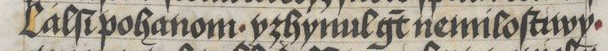Lalſi pohanom.y zhynul ḡt nemiloſtiwy.
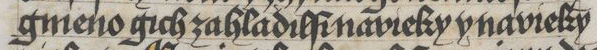gmeno gich zahladilſi navieky y navieky
